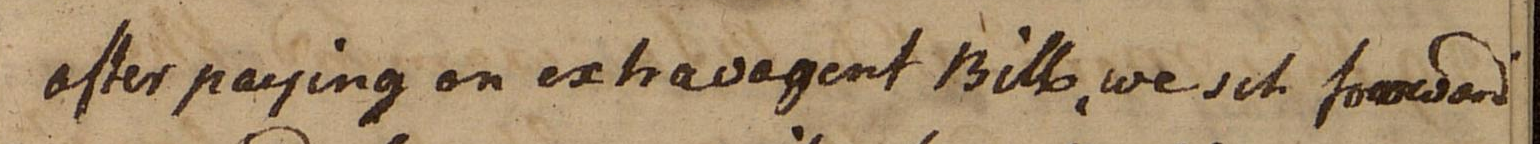after paying an extravagent Bill, we set forward
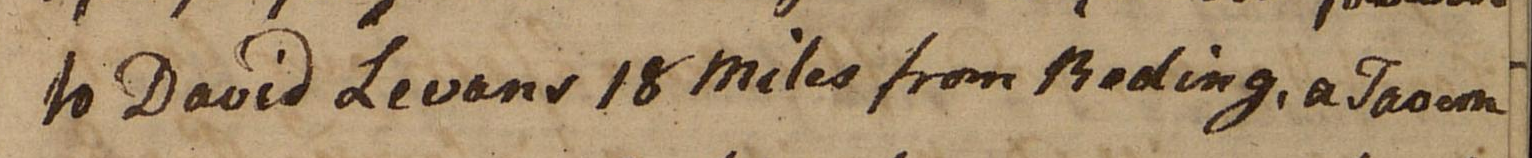to David Levans 18 miles from Reding, a Tavern
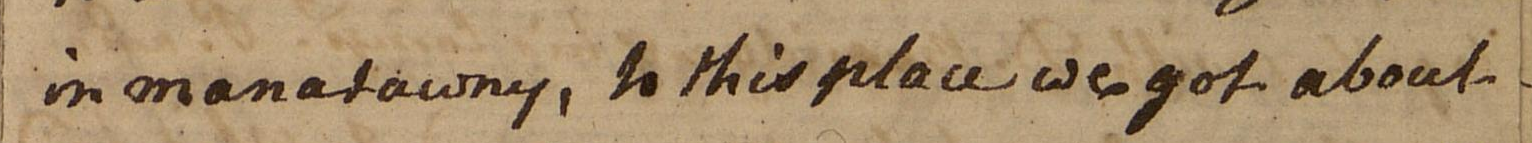in manatawny?, to this place we got about.
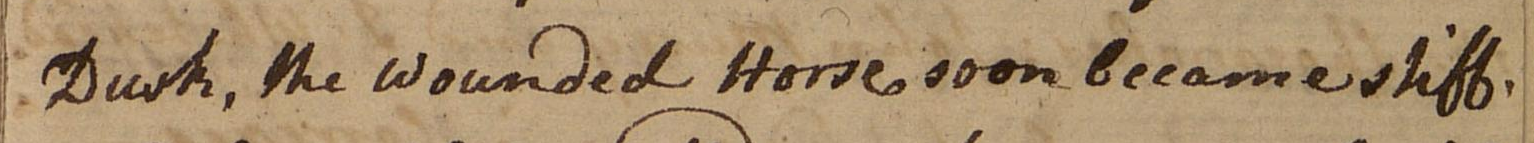Dusk, the Wounded Horse soon became stiff.
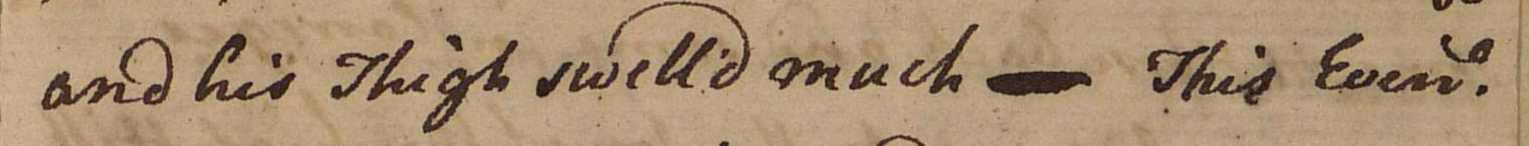and his Thigh swell'd much- This Even^g.
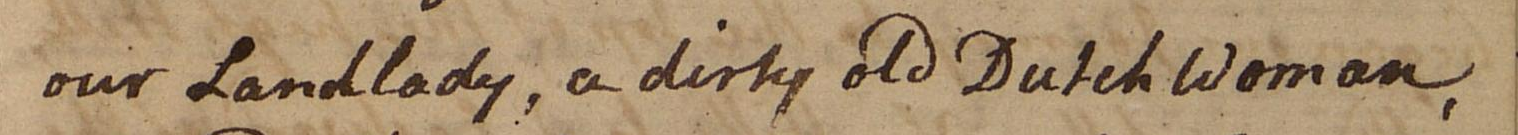our Landlady, a dirty old Dutch woman,
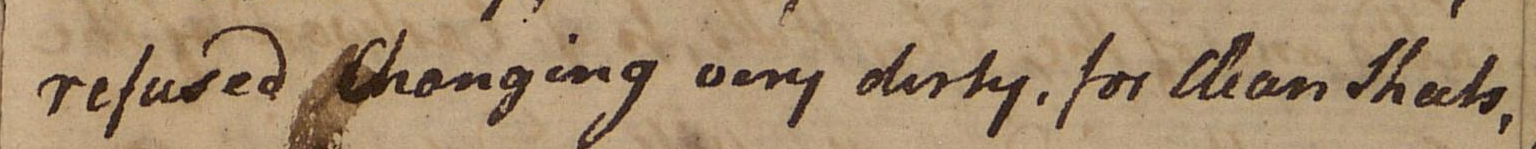refused Changing very dirty, for clean Sheets,
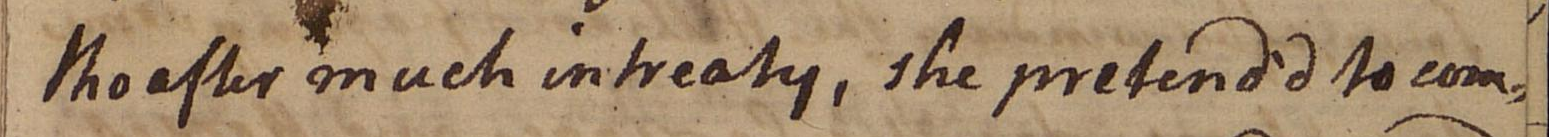tho after much intreaty, she pretend'd to com-
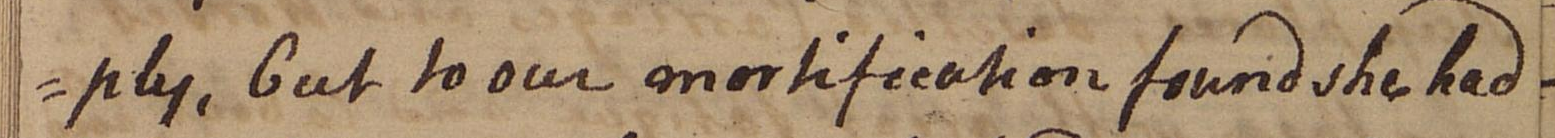-ply, but to our mortification found she had
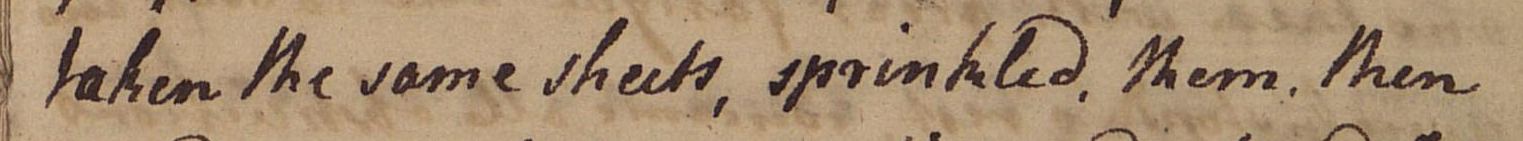taken the same sheets, sprinkled, them. then
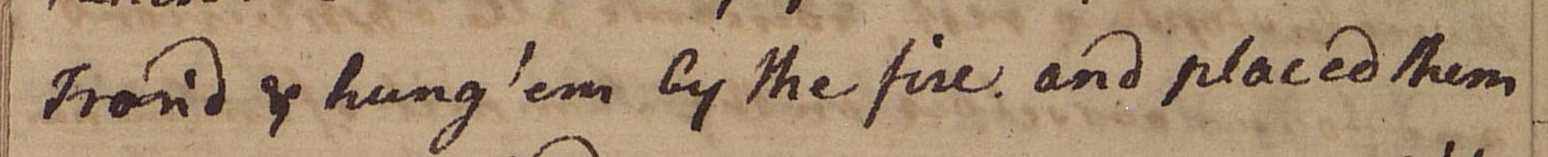Fron'd & hung 'em by the fire, and placed them
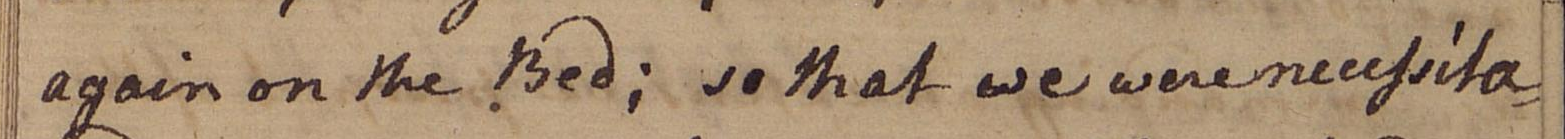again on the Bed; so that we were necessita-
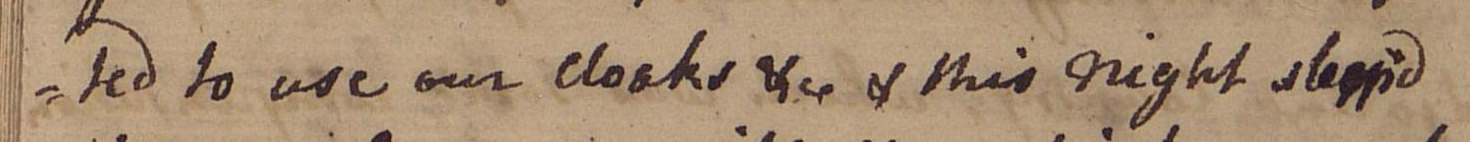-ted to use our cloaks &c & this night sleepd
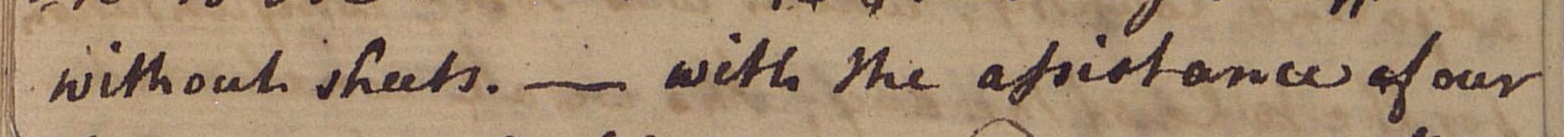without sheets.- with the assistance of our
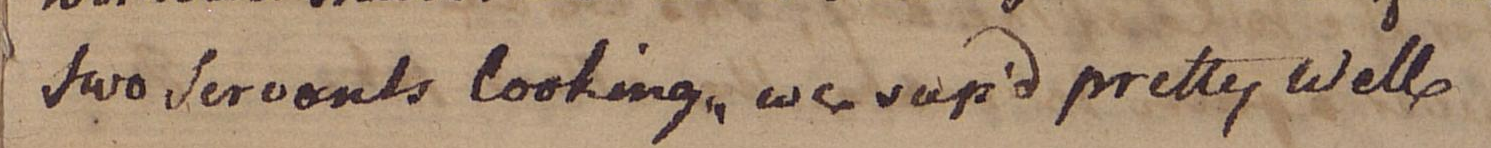two Servents looking, we sup'd pretty well
